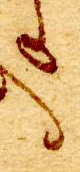To
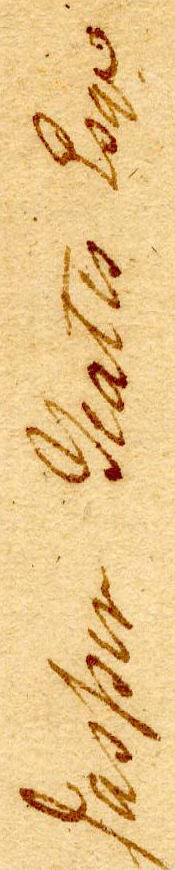Jasper Yeates Esqr
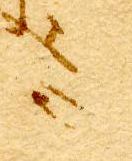at
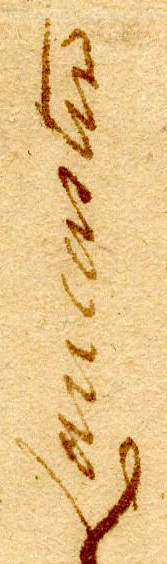Lancaster
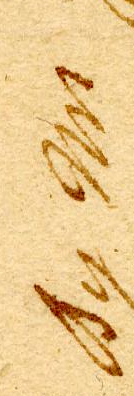By Wm
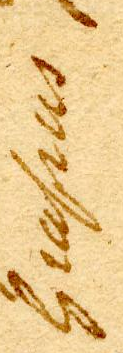Grafrus
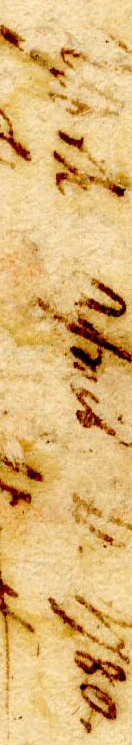York April 11. 1780
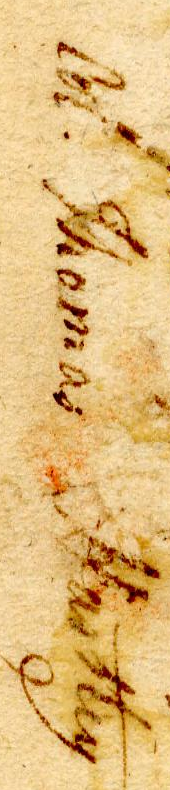Col. Thomas Hartley
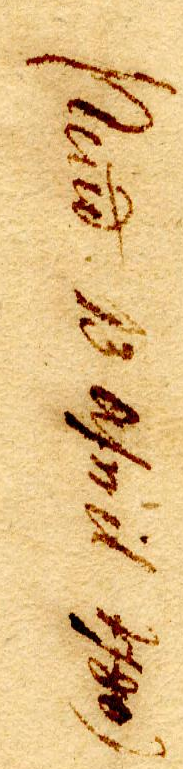(Reced 13 April 1780)
